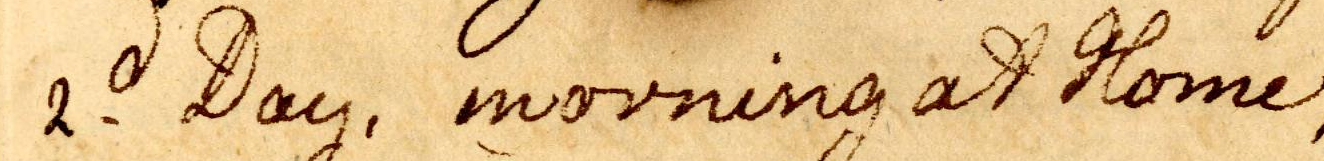2^d Day. morning at Home,
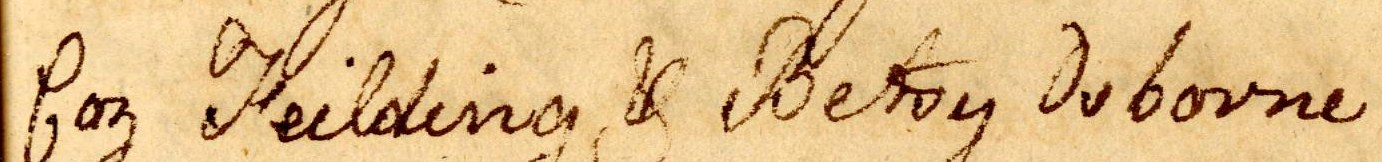Coz Feilding & Betsy Osborne
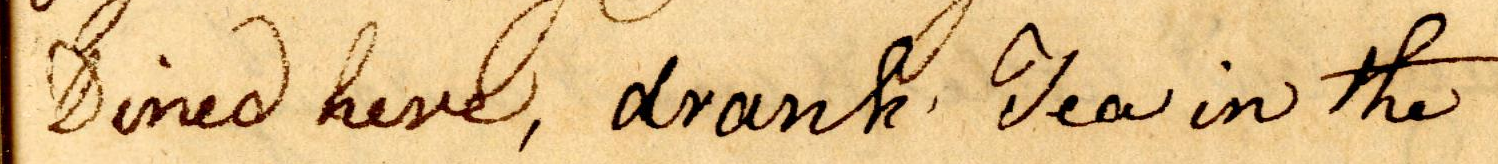Dined here, drank Tea in the
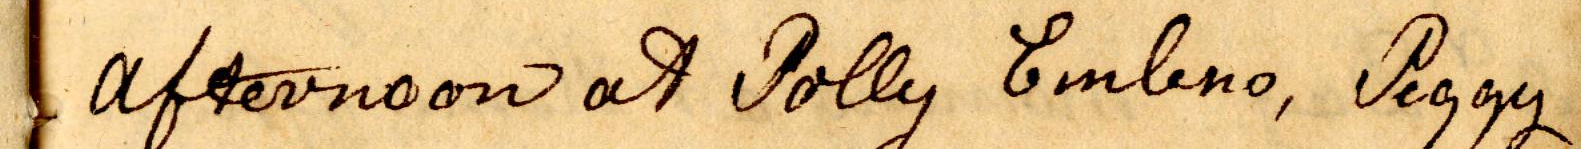Afternoon at Polly Emlens, Peggy
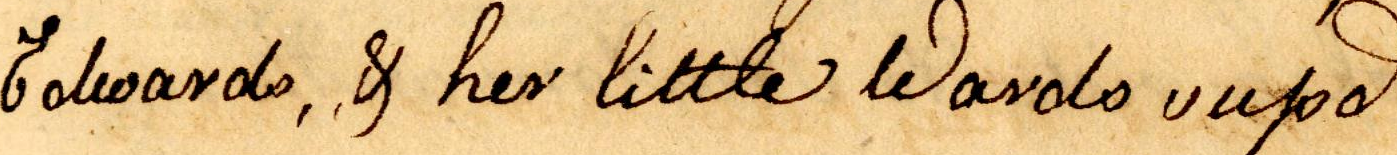Edwards, & her little Wards supd
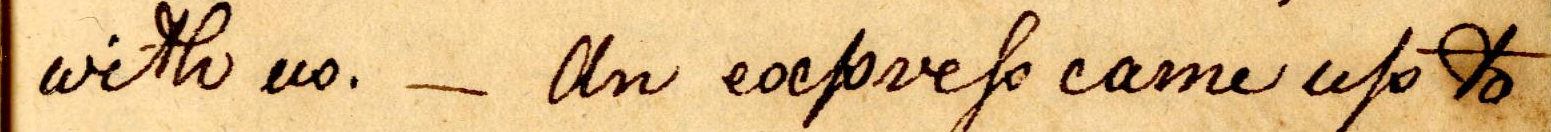with us.- An express came up to
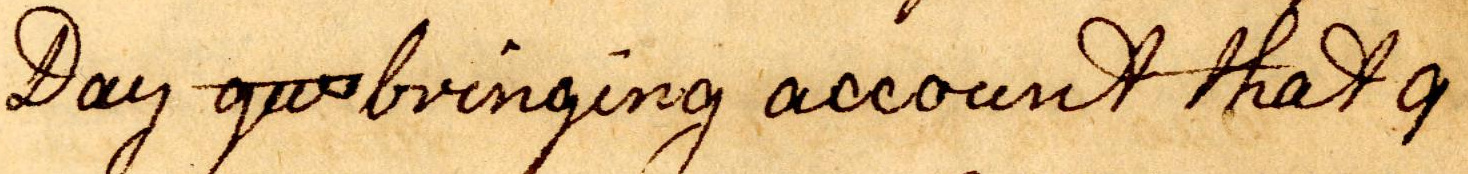Day [giv] bringing account that 9
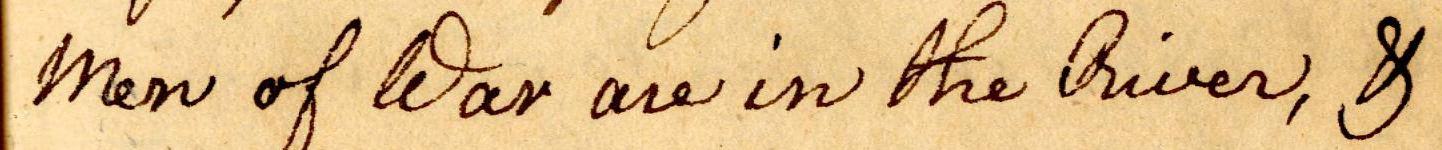Men of War are in the River, &
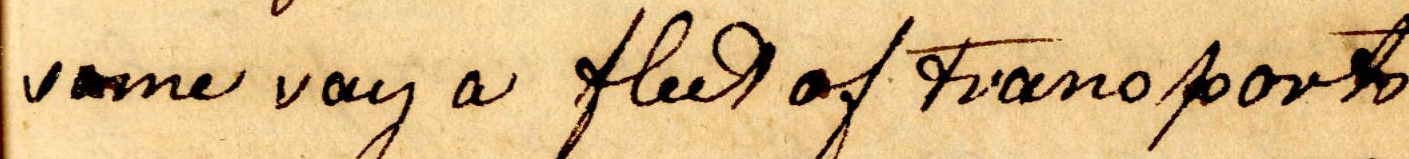some say a fleet of transports
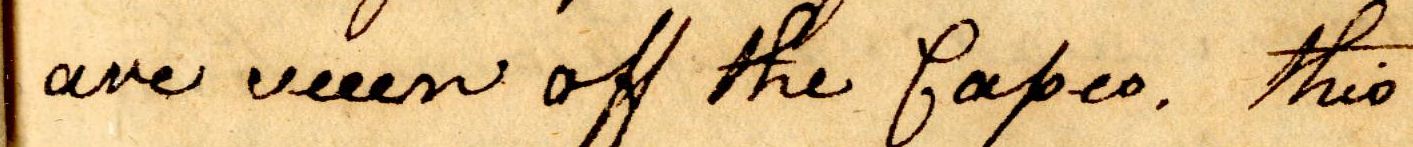are seeen off the Capes. this
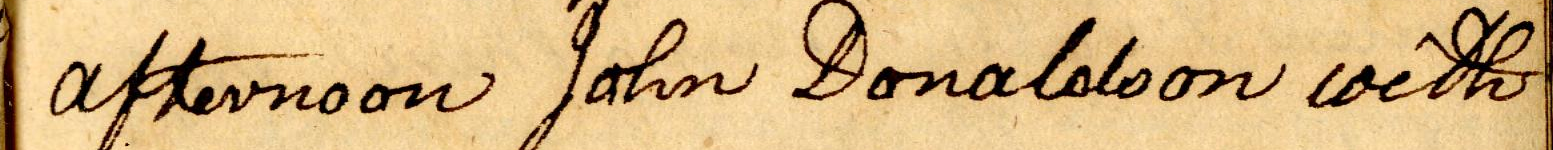Afternoon John Donaldson with
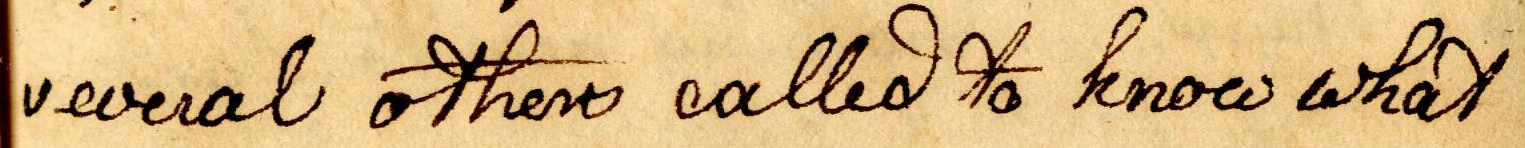several others called to know what
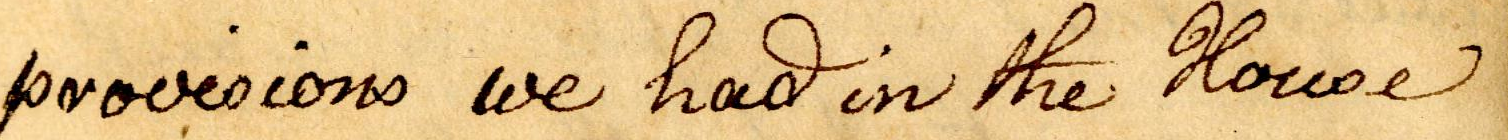provisions we had in the House
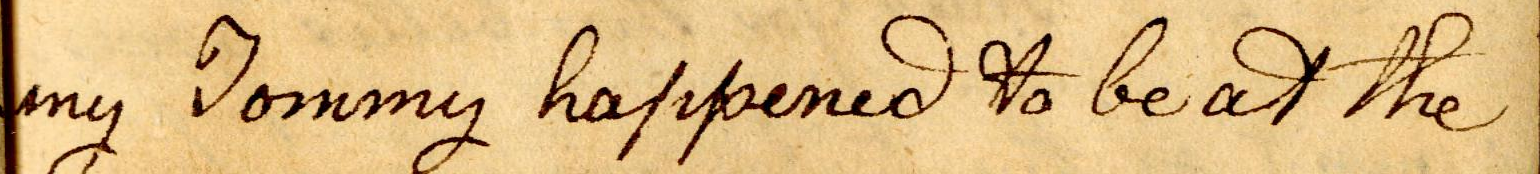my Tommy happened to be at the
